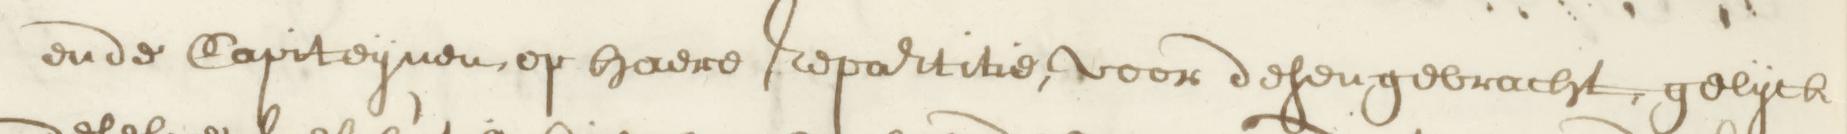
ende Capiteijnen, op haere Repartitie, voor desen gebracht, gelijck
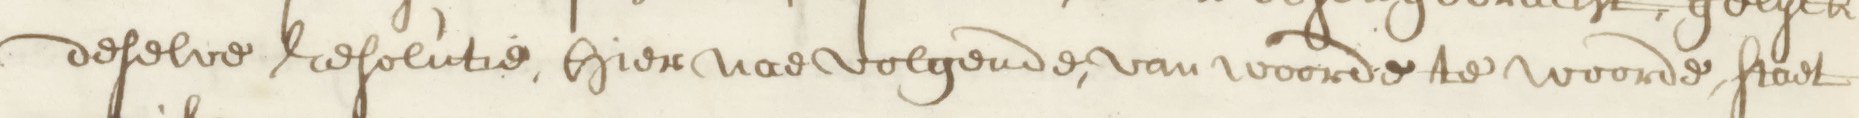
deselve resolutie, hier naevolgende, van woorde te woorde, staet
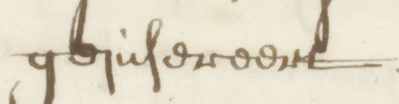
geinsereert.
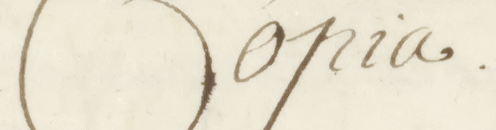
Copia.
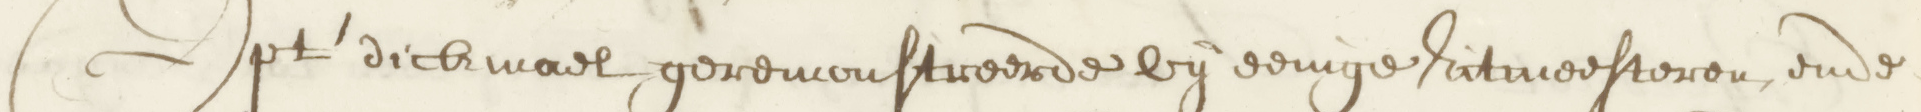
Opt dickmael geremonstreerde bij eenige Ritmeesteren, ende
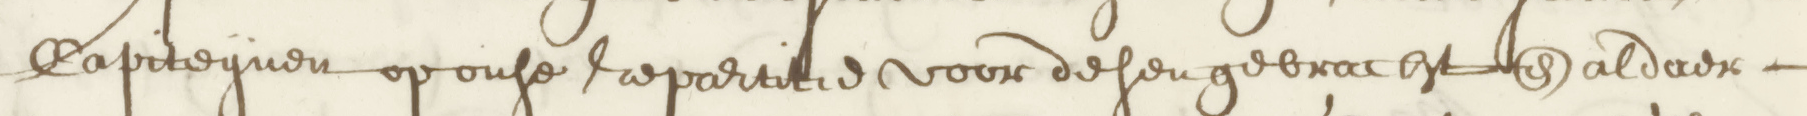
Capiteijnen op onse repartitie voor desen gebracht & aldaer -
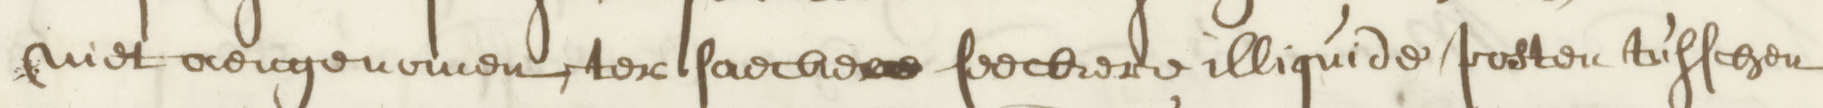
niet aengenomen, ter saeckere seeckere illiquide posten tusschen
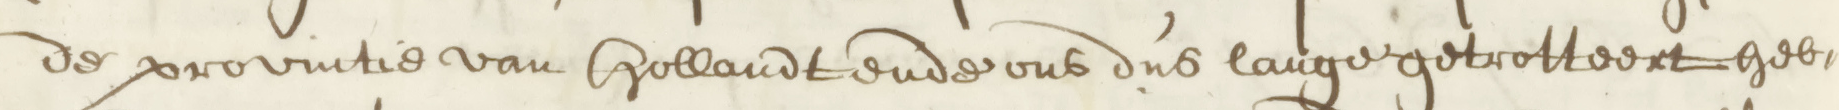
de provintie van Hollandt ende ons dus lange getrotteert heb,,
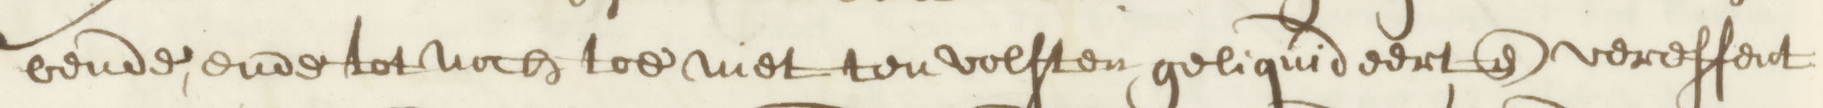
bende, ende tot noch toe niet ten volsten geliquideert & vereffent
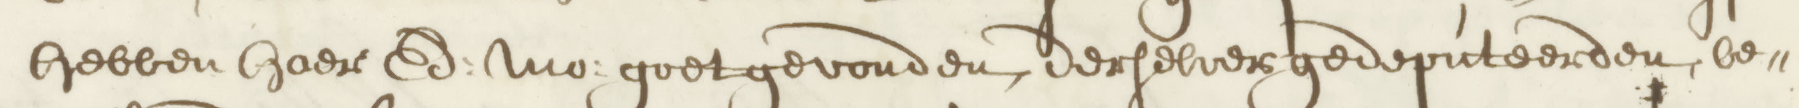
hebben haer Ed:Mo: goetgevonden, derselver gedeputeerden, be„
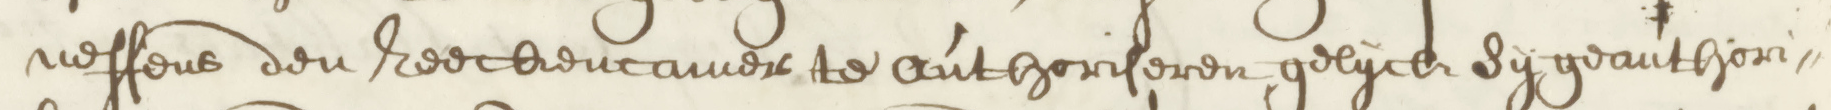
neffens den reeckencamer te authoriseren gelijck sij geauthori„
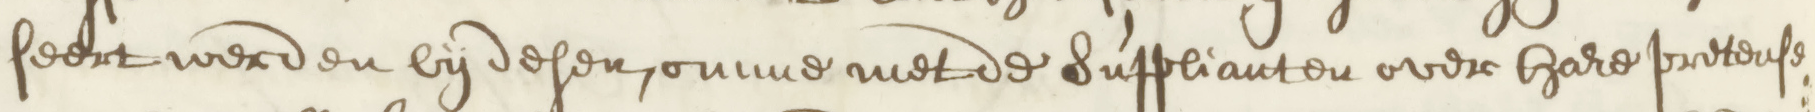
seert werden bij desen, omme met de Supplianten over hare pretense
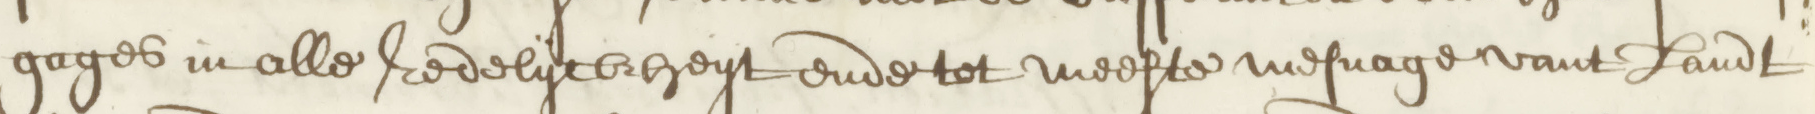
gages in alle redelijckheijt ende tot meeste mesnage vant Landt
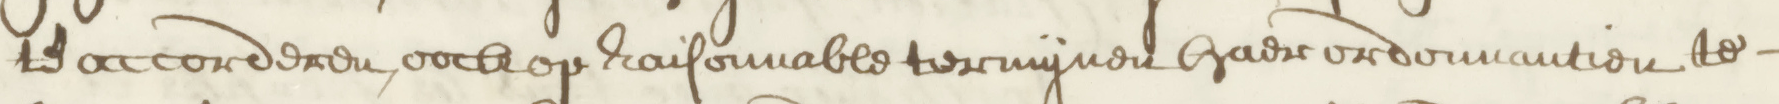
te accorderen, oock op raisonnable termijnen haer ordonnantien te —
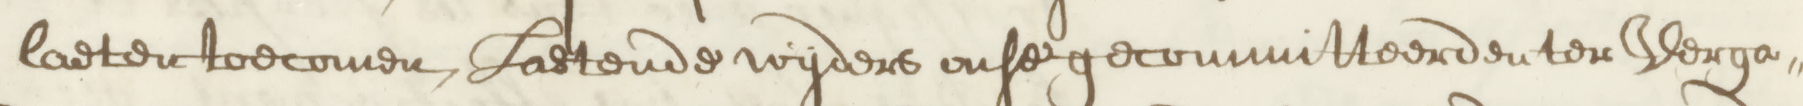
laeten toecomen. Lastende wijders onse gecommitteerden ter Verga„
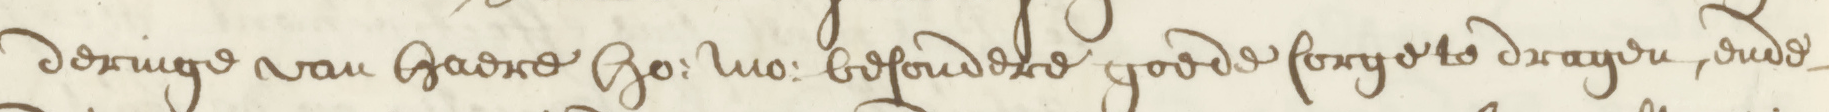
deringe van haere Ho:Mo: besondere goede sorge te dragen, ende
